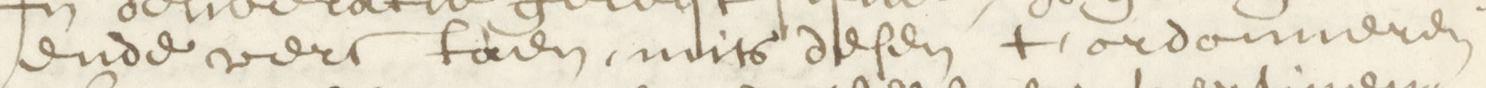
ende verstaen, mits desen t‛ordonneren
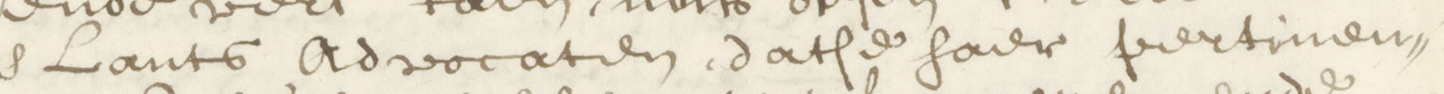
sLants Advocaten, datse haer pertinen„
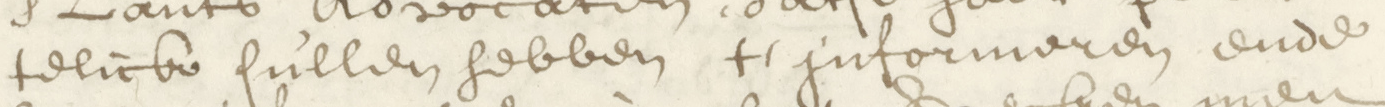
telick sullen hebben t' informeren ende
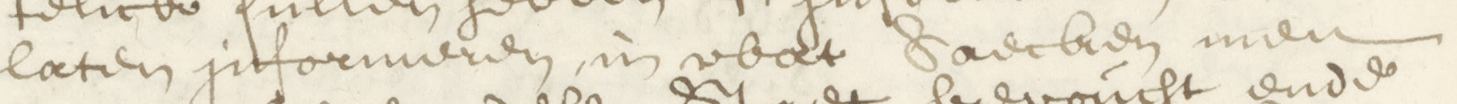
laten informeren, in wat Saecken men
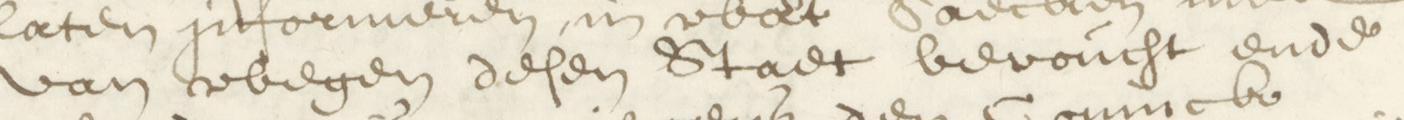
van wegen desen Staet bevoucht ende
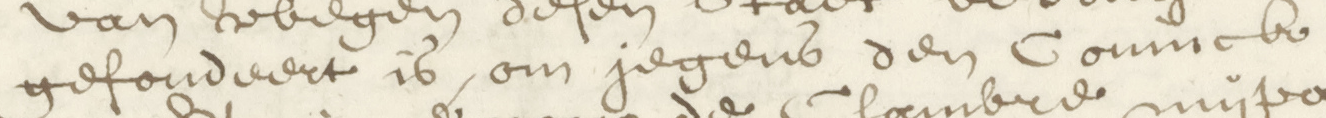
gefondeert is, om jegens den Coninck
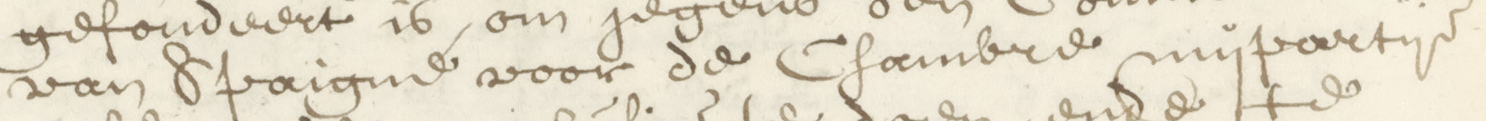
van Spaigne voor de Chambre mijpartije
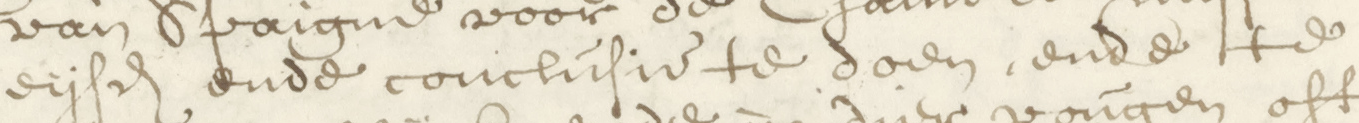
eijsch ende conclusie te doen, ende te
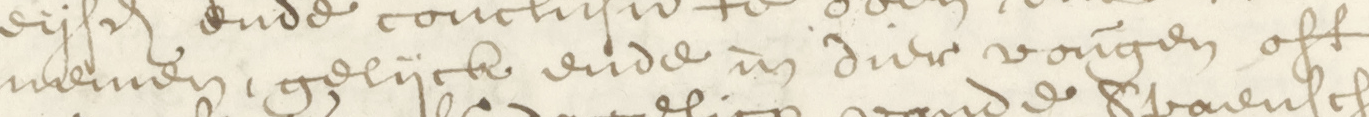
nemen, gelijck ende in dier vougen off
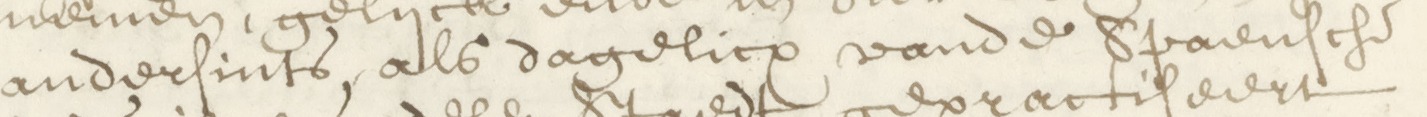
andersints als dagelicx vande Spaensche
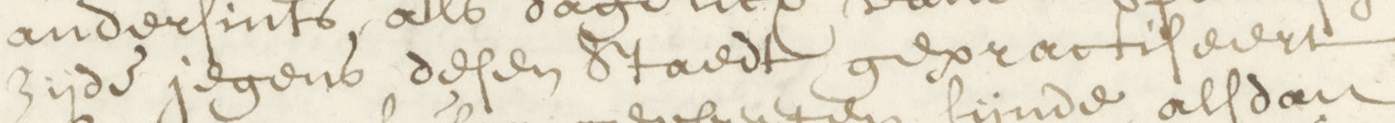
zijde jegens desen Staedt gepractiseert
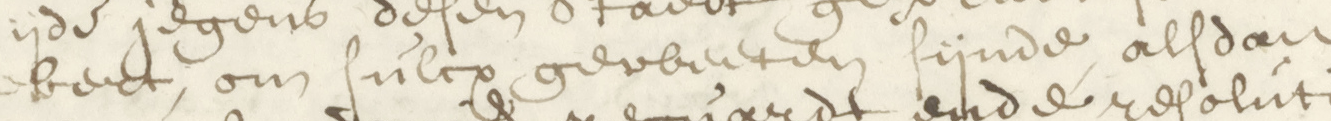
wert, om sulcx geweeten sijnde alsdan
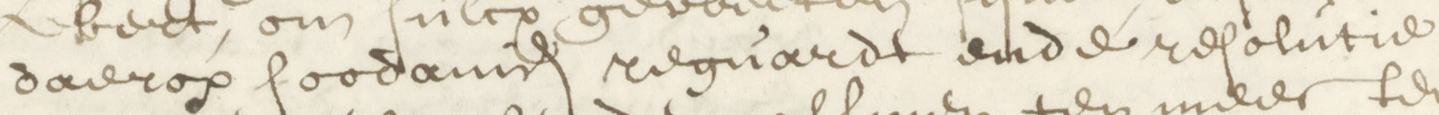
daerop soodanich reguardt ende resolutie
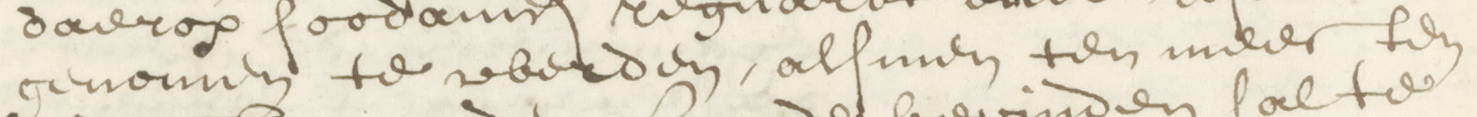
genomen te werden, alsmen ten meesten
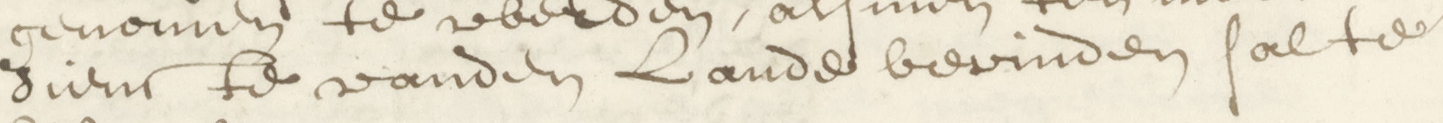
dienste vanden Lande bevinden sal te
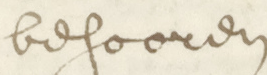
behooren
